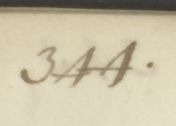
344
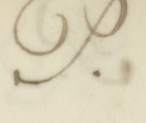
P.
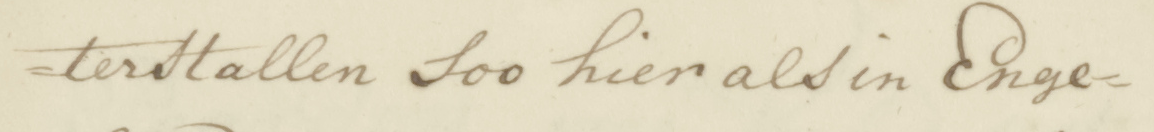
terstallen soo hier als in Enge„
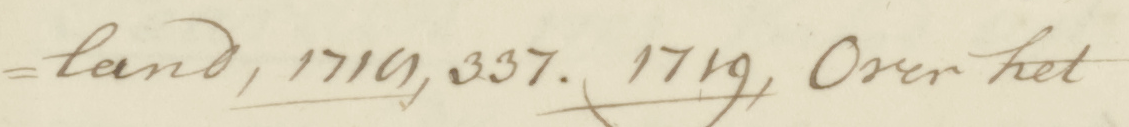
land, 1718, 337. 1719, Over het
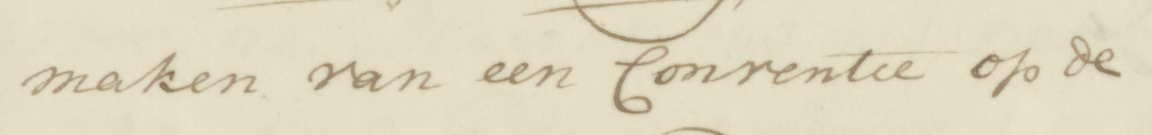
maken van een conventie op de
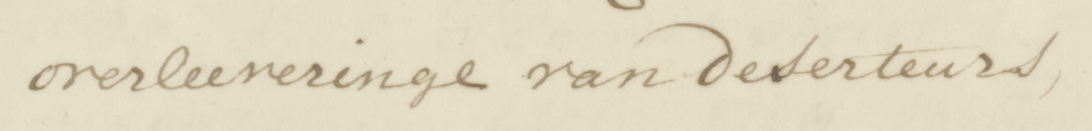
overleeveringe van deserteurs
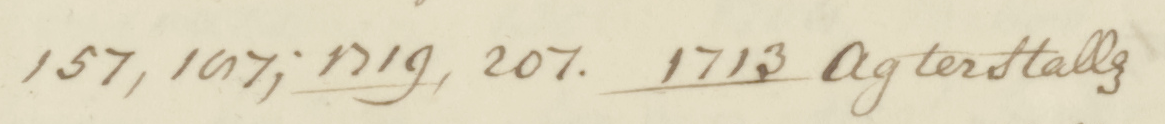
157, 187; 1719, 207. 1713 Agterstalle
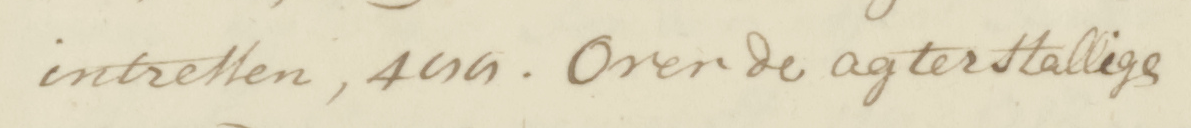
intressen, 488. Over de agterstallige
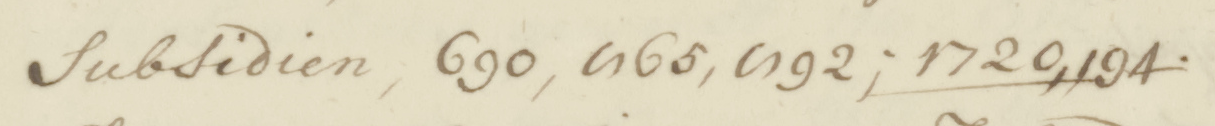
subsidien, 690, 865, 892; 1720, 194.
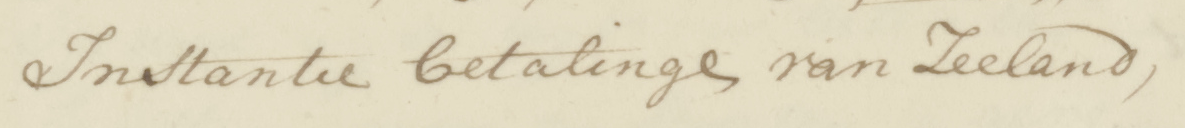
Instantie betalingen van Zeeland,
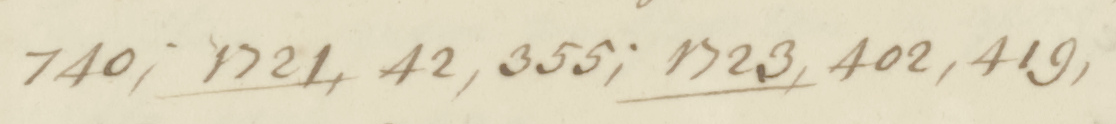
740; 1721, 42, 355; 1723, 402, 419,
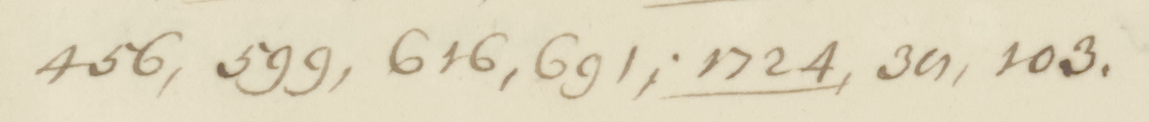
456, 599, 616, 691; 1724, 38, 103.
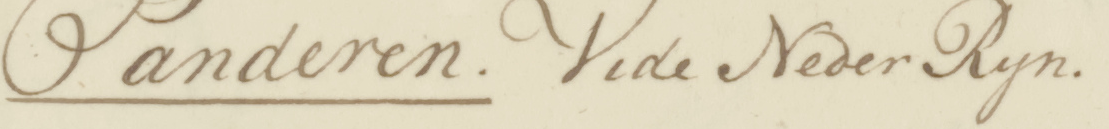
Panderen vide Neder Rijn.
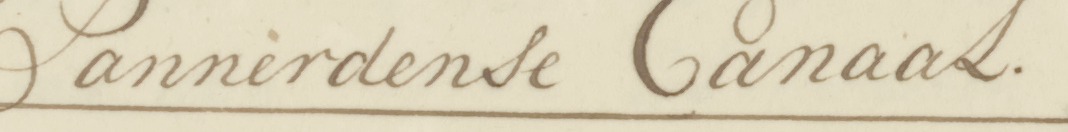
Pennerdense Canaal
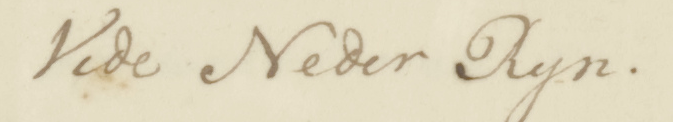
vide Neder Rijn.
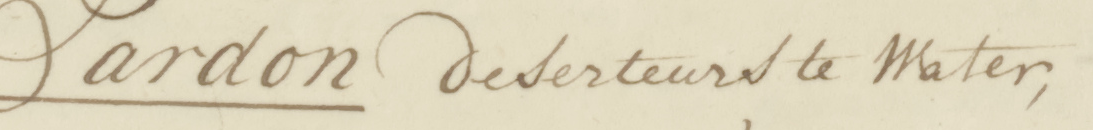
Pardon deserteurs te water,
